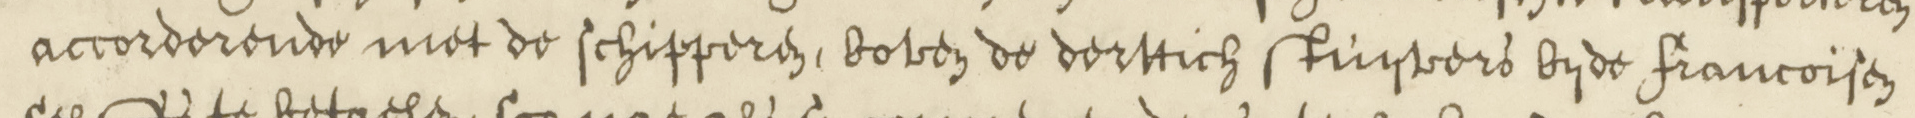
accorderende met de schipperen, boven de derttich stuyvers byde francoisen
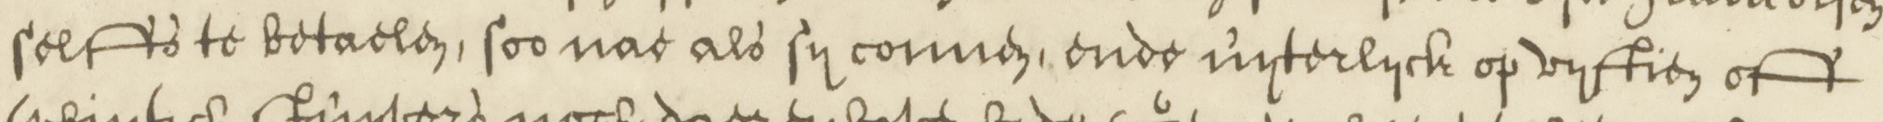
selffs te betaelen, soo nae als sy connen, ende uyterlyck op vyftien off
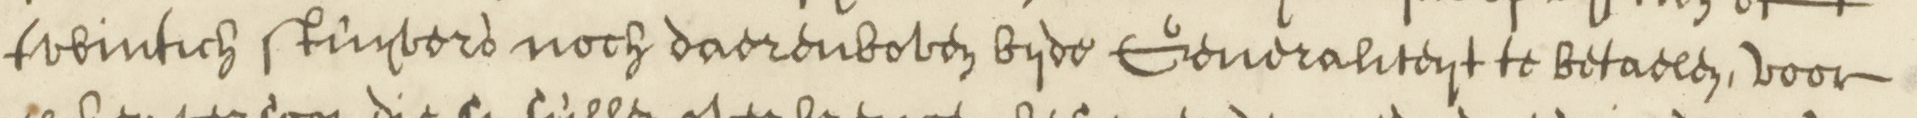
twintich stuyvers noch daerenboven byde Generaliteyt te betaelen, voor
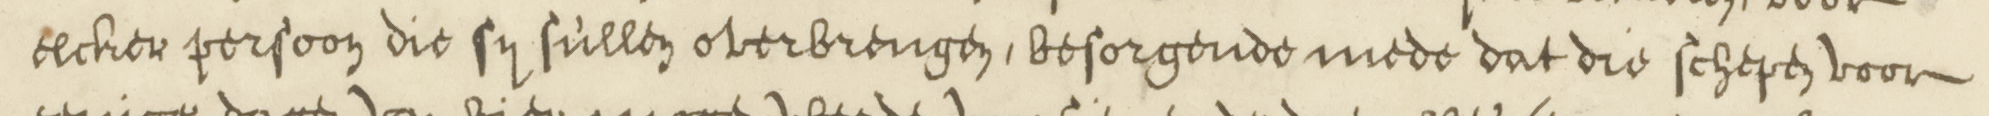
elcker persoon die sy sullen overbrengen, besorgende mede dat die schepen voor
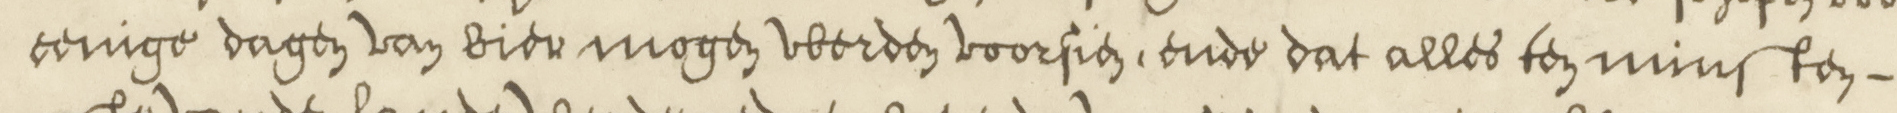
eenige dagen van bier mogen werden voorsien, ende dat alles ten minsten -
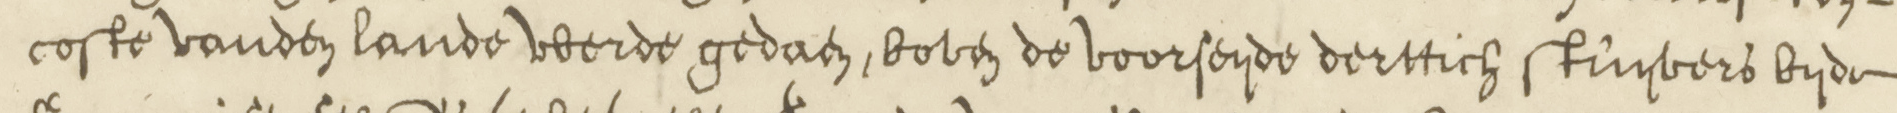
coste vanden lande werde gedaen, boven de voorseyde derttich stuyvers byde
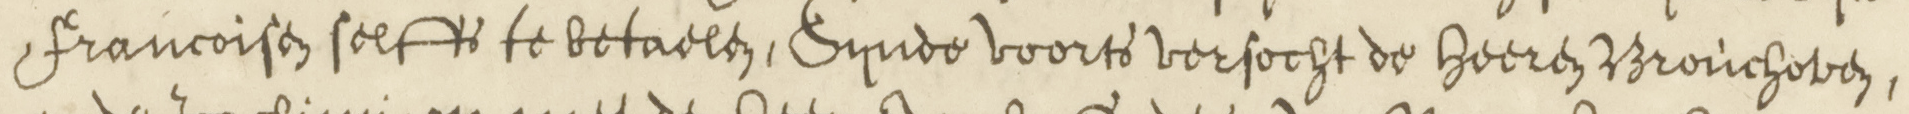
francoisen selffs te betaelen. Synde voorts versocht de heeren Brouchoven,
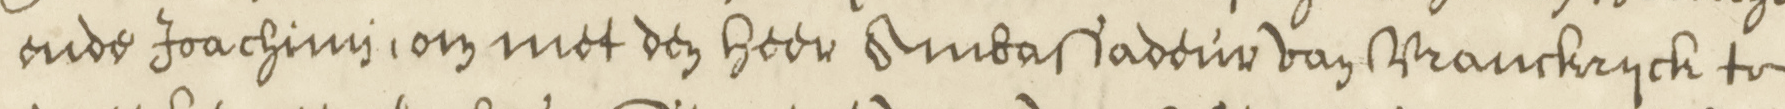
ende Joachimi, om met den heer Ambassadeur van Vranckryck te
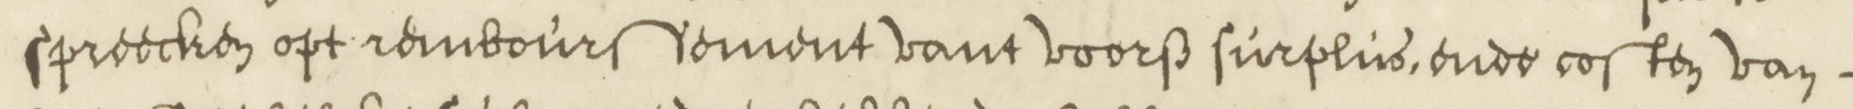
spreecken opt rembourssement vant voors surplus, ende costen van -
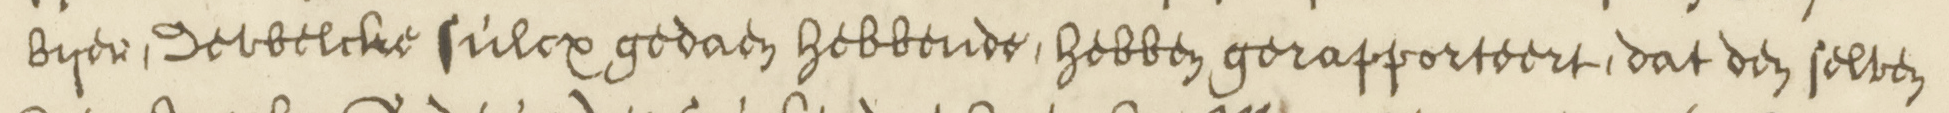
byer, Dewelcke sulcx gedaen hebbende, hebben gerapporteert, dat den selven
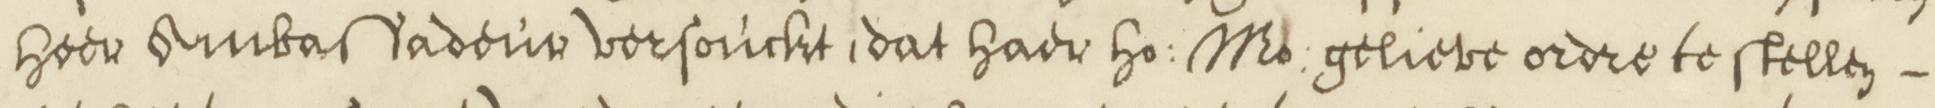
heer Ambassadeur versouckt, dat haer ho:Mo: gelieve ordre te stellen -
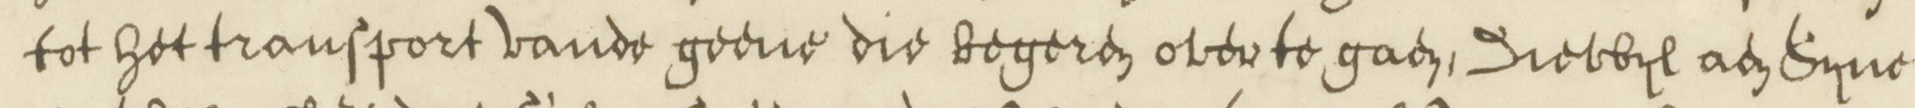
tot het transport vande geene die begeren over te gaen, Diewyl aen Syne
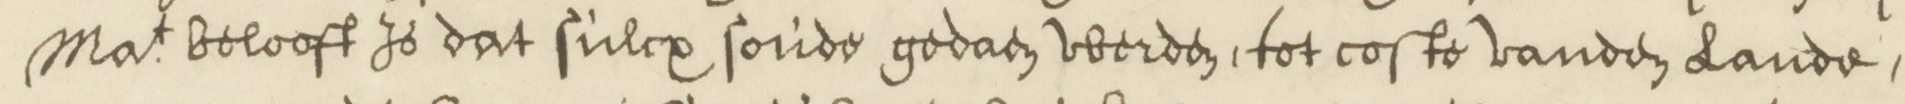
Mat. belooft Is dat sulcx soude gedaen werden, tot coste vanden Lande.
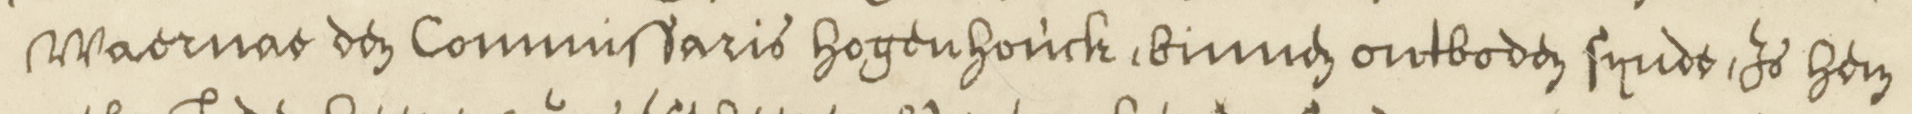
Waernae den Commissaris hogenhouck, binnen ontboden synde, Is hem
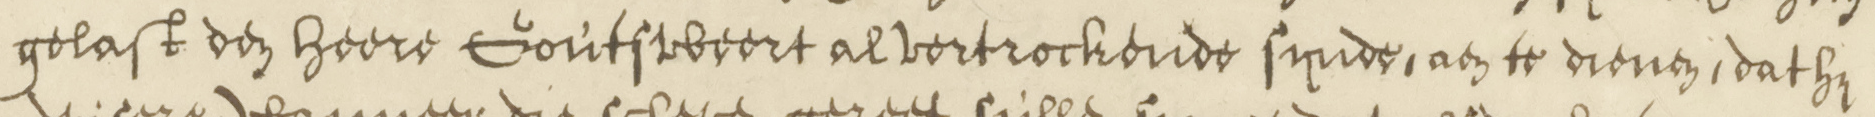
gelast den heere Goutsweert al vertrockende synde, aen te dienen, dat hy
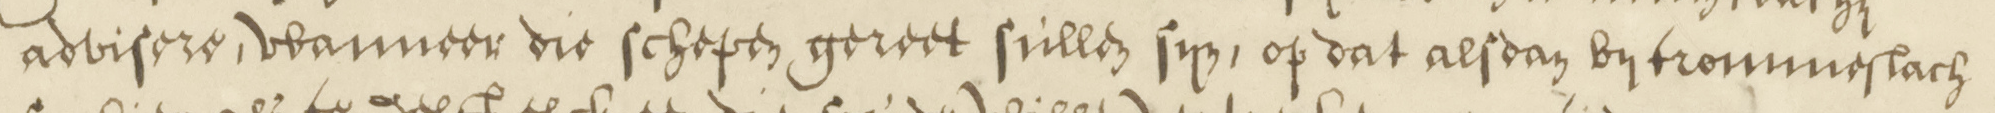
advisere, wanneer die schepen gereet sullen syn, op dat alsdan bij trommeslach
